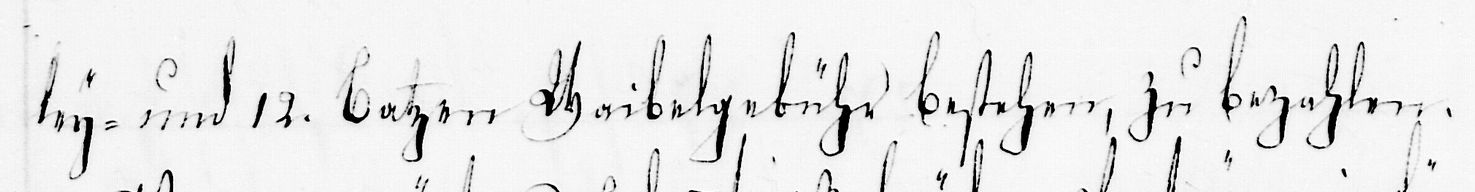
ley- und 12. Batzen Waibelgebühr bestehen, zu bezahlen.
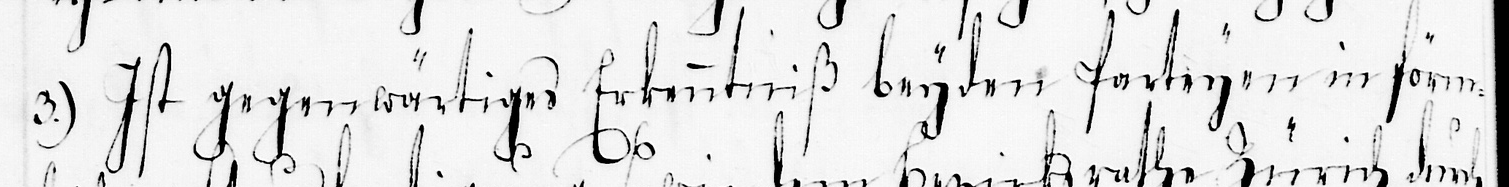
3.) Ist gegenwärtiges Erkenntniß beyden Parteyen in förm¬
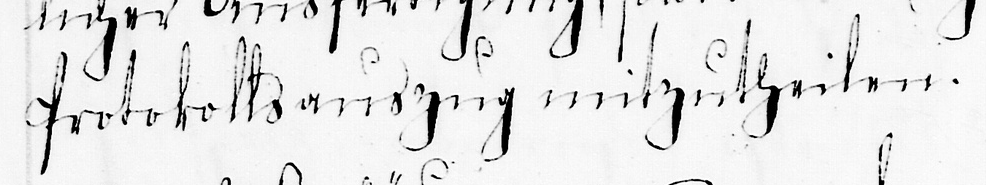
Protokollsauszug mitzutheilen.
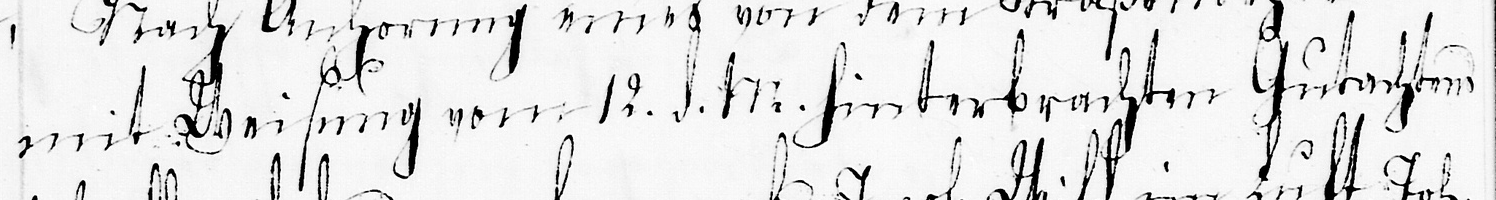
mit Weisung vom 12. d. M. hinterbrachten Gutachtens
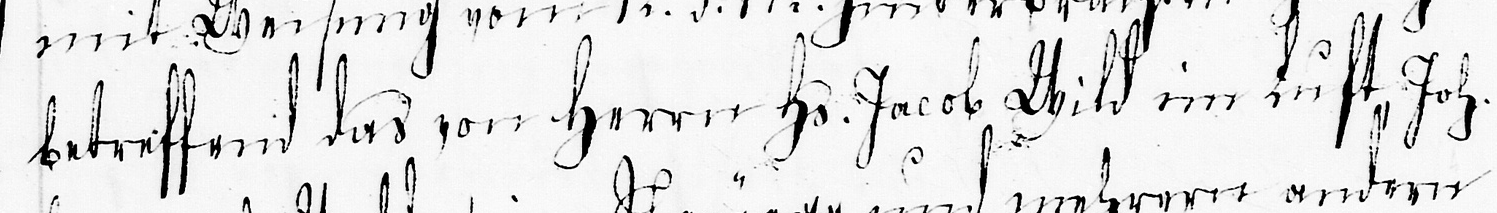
betreffend das von Herrn Hs. Jacob Wild im Luft, Joh.
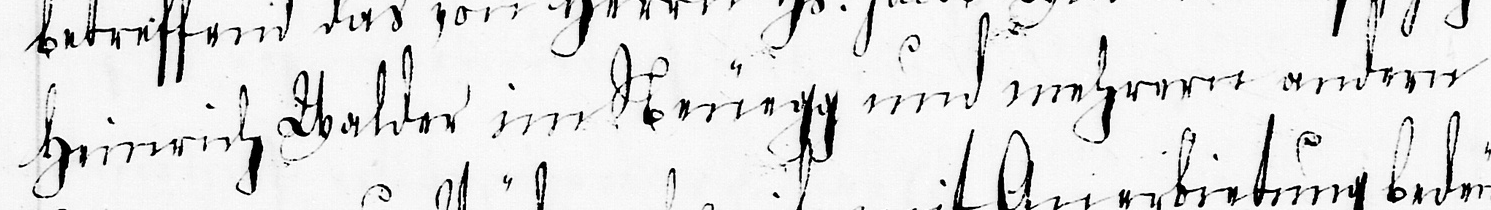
Heinrich Walder im Neuegg und mehrern andern
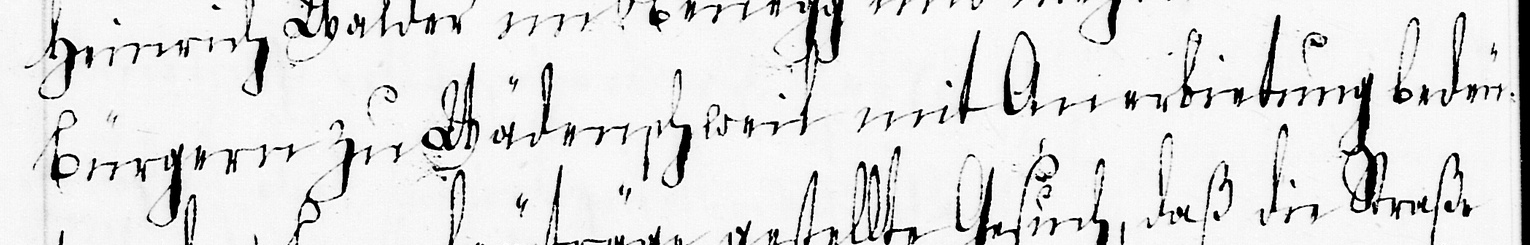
Bürgern zu Wädenschweil mit Anerbietung bedeu¬
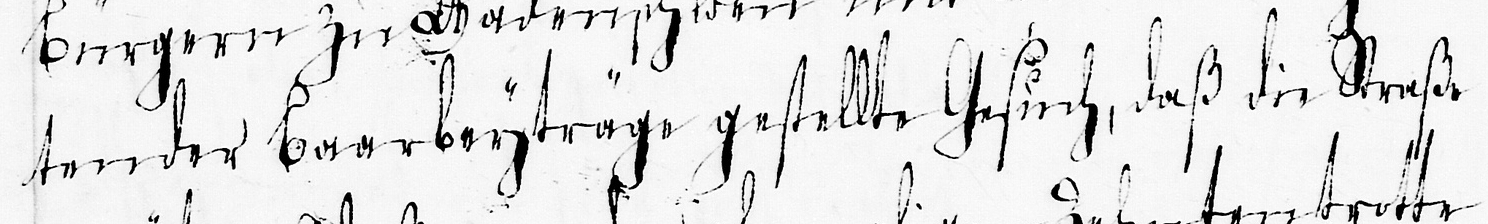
tender Baarbeyträge gestellte Gesuch, daß die Straße
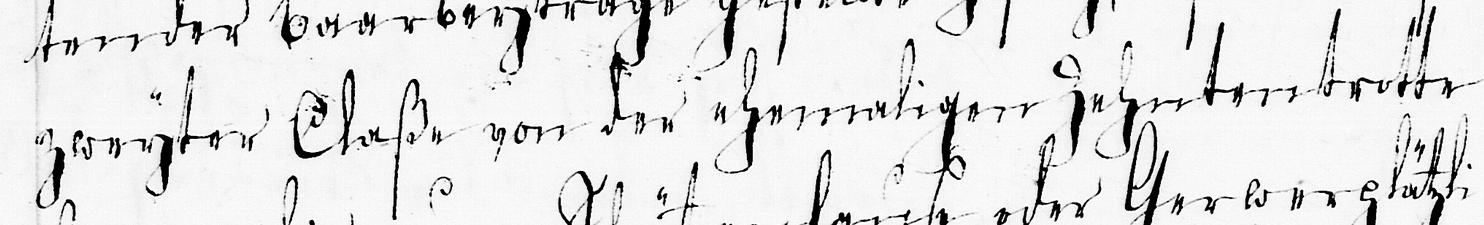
zweyter Claße von der ehemaligen Zehntentrotte
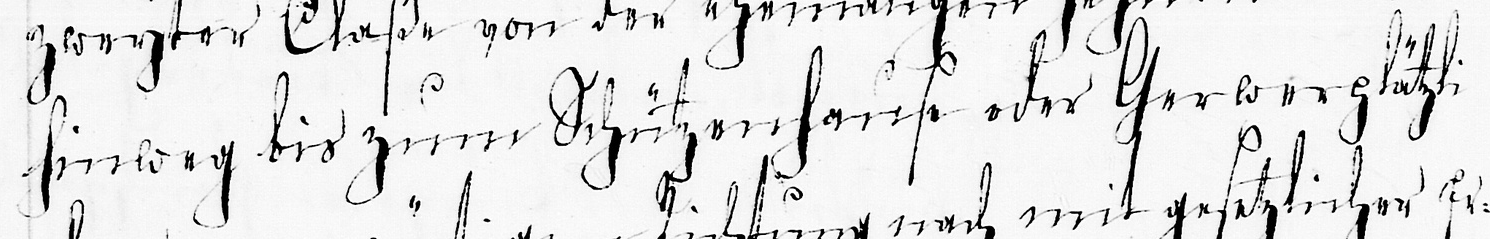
hinweg bis zum Schützenhause oder Gerwerplätzli
